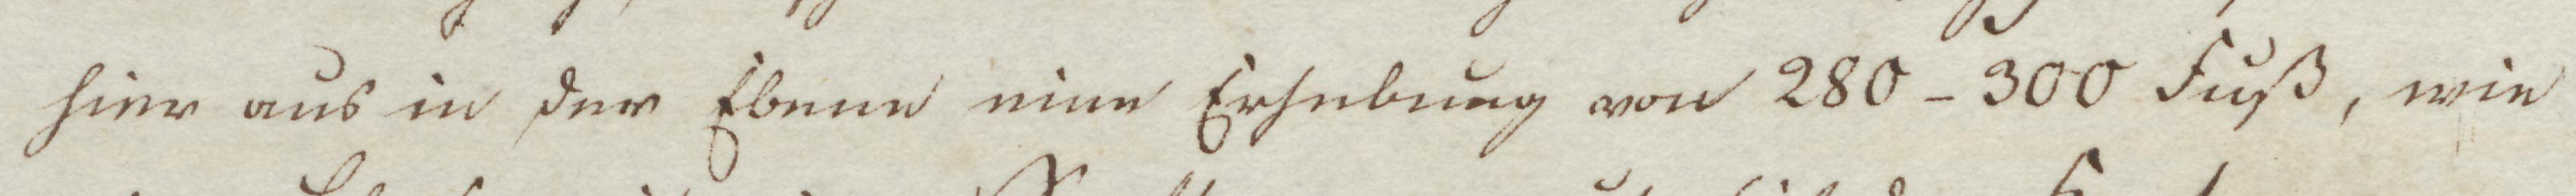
hier aus in der Ebene eine Erhebung von 280–300 Fuß, wie
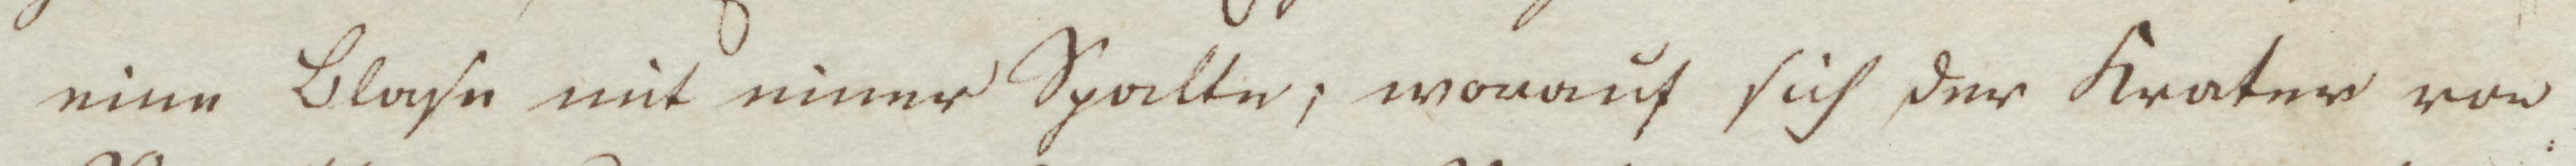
eine Blase mit einer Spalte; worauf sich der Krater von
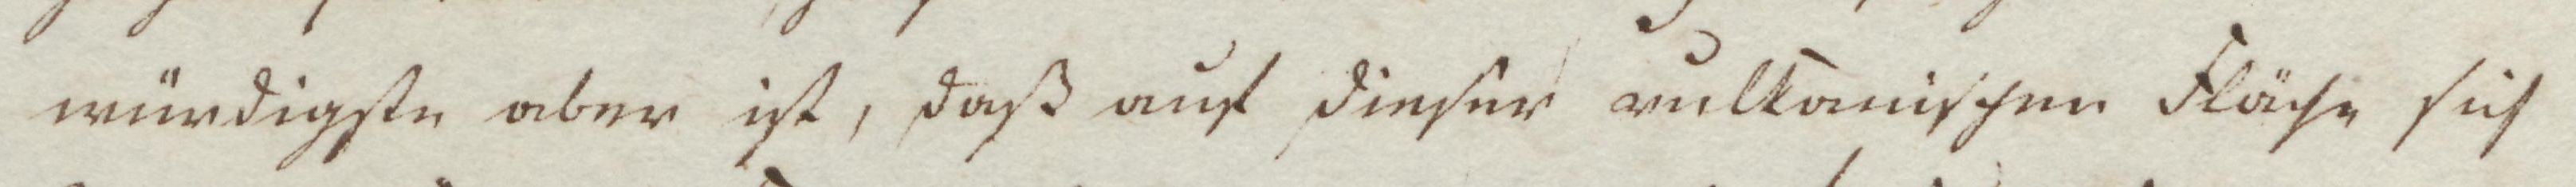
würdigste aber ist, daß auf dieser vulkanischen Fläche sich
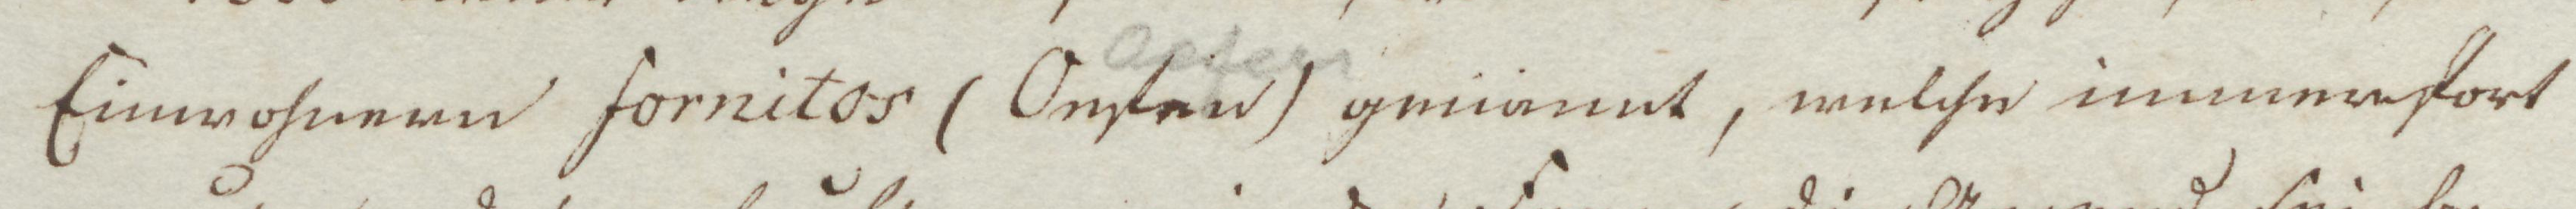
Einwohnern fornitos genannt, welche immerfort
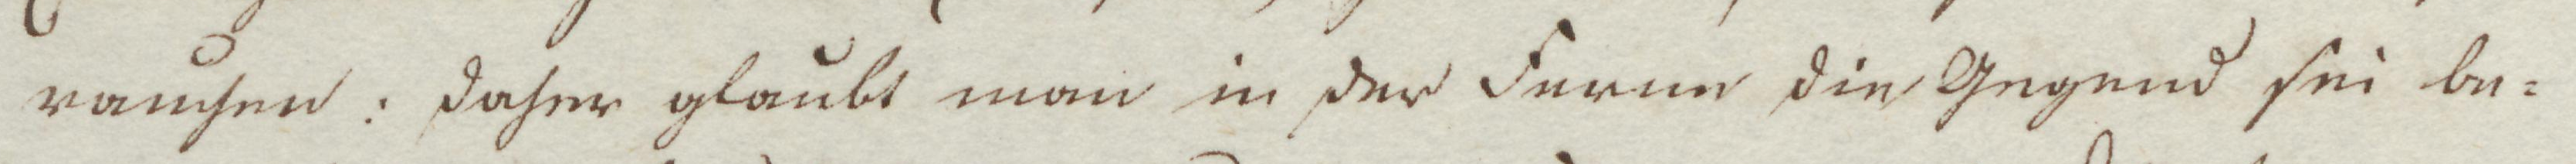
rauchen: daher glaubt man in der Ferne die Gegend sei be-
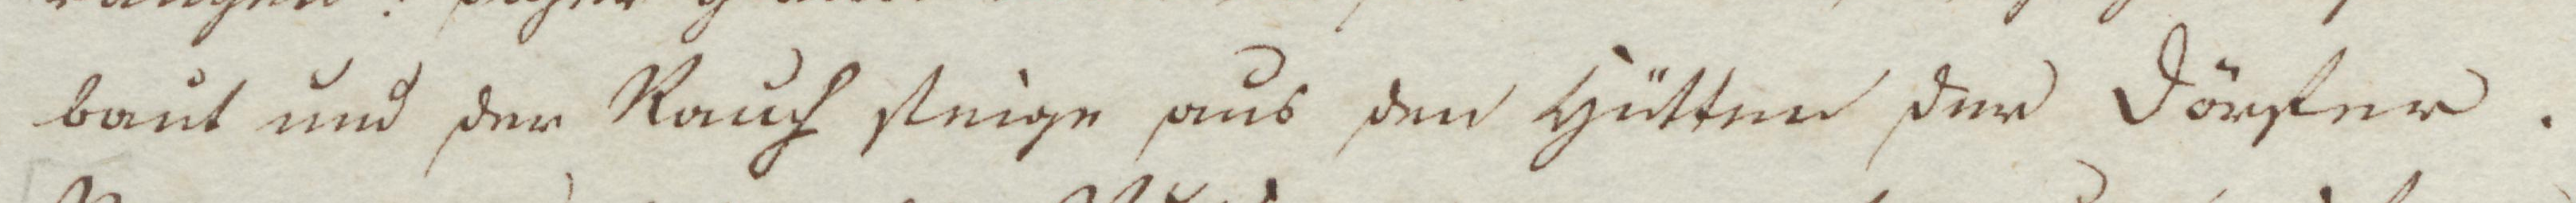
baut und der Rauch steige aus den Hütten der Dörfer.
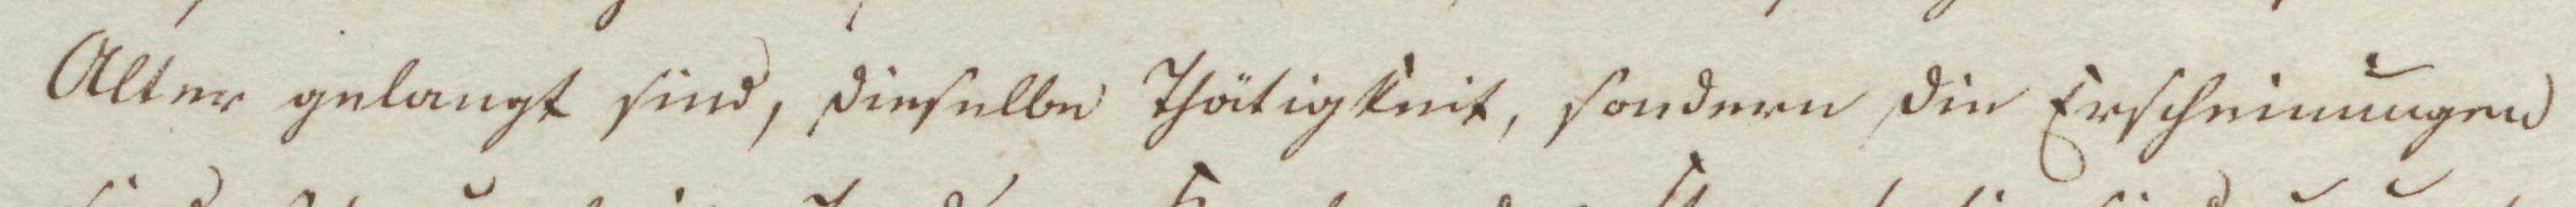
Alter gelangt sind, dieselbe Thätigkeit, sondern die Erscheinungen
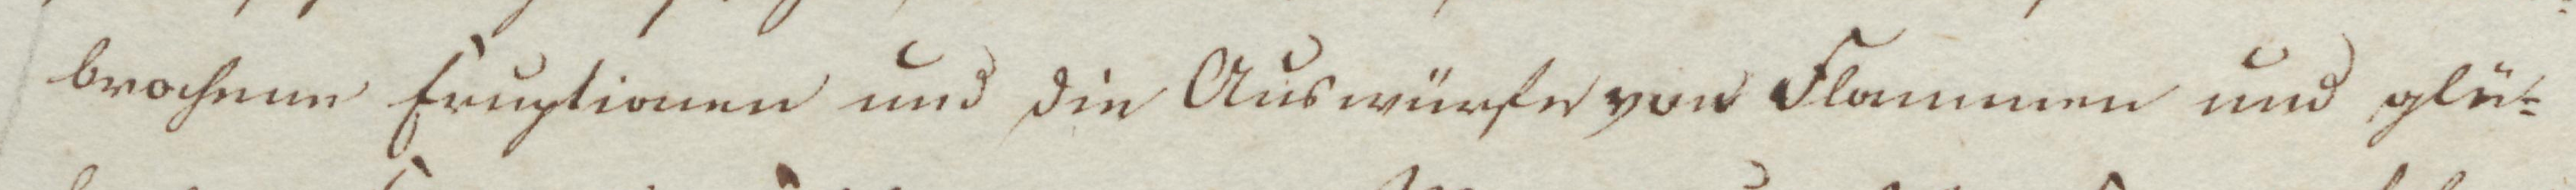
brochen Eruptionen und die Auswürfe von Flammen und glü-
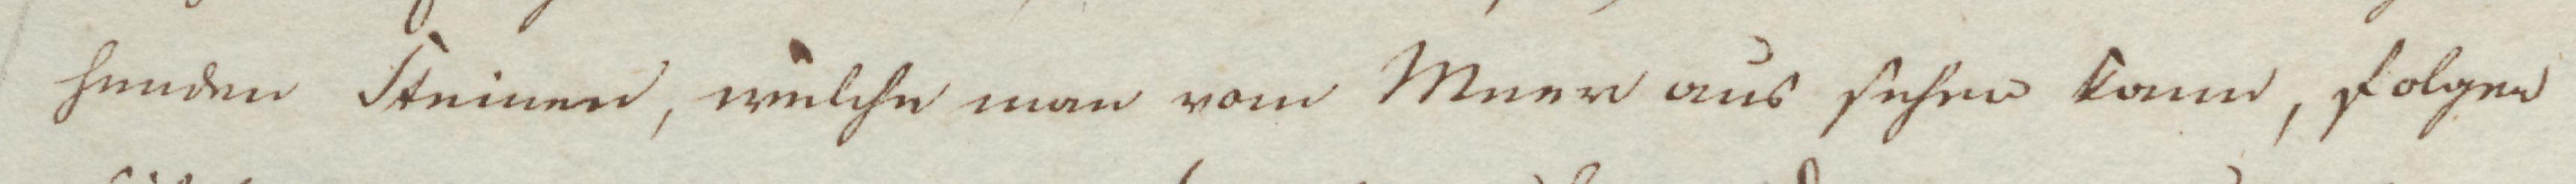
henden Steinen, welche man vom Meer aus sehen kann, folgen
